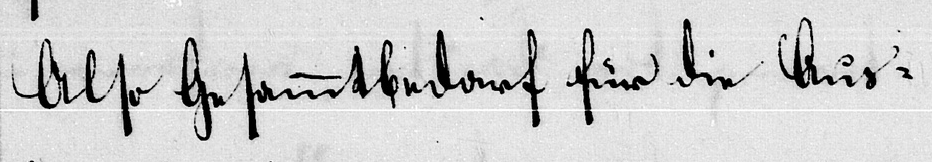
Also Gesammtbedarf für die Aus¬
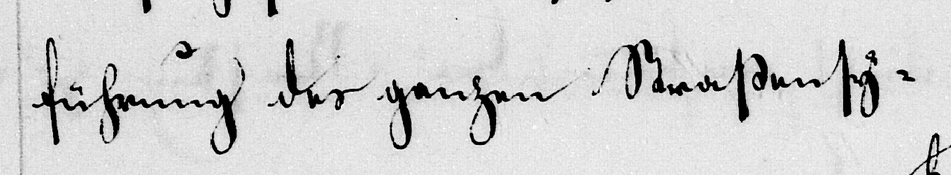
führung des ganzen Straßensy¬
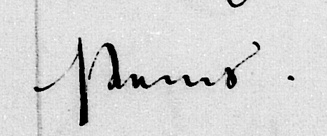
stems
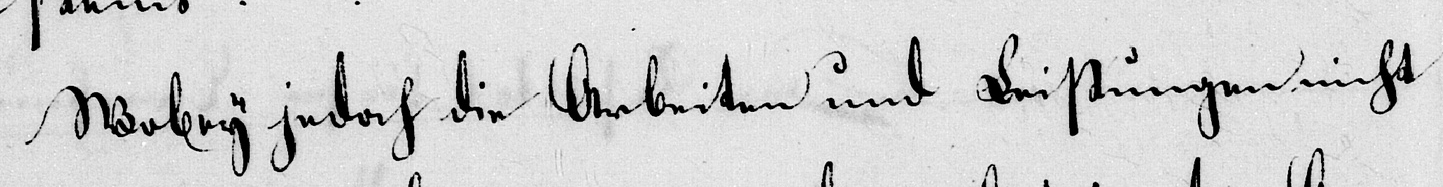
Wobey jedoch die Arbeiten und Leistungen nicht
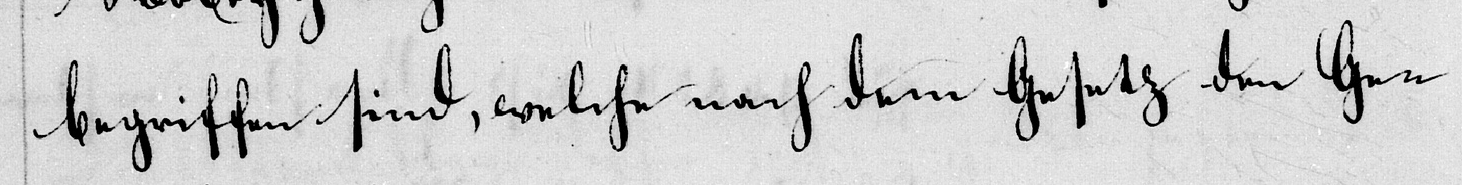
begriffen sind, welche nach dem Gesetz den Ge¬
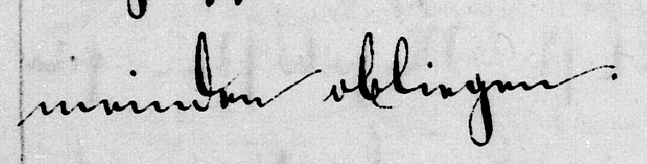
meinden obliegen.
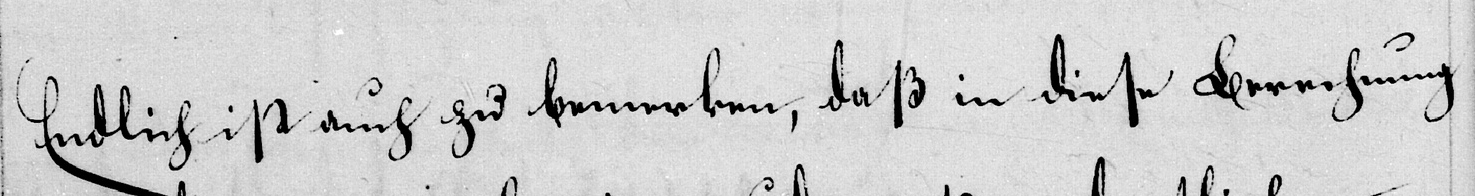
Endlich ist auch zu bemerken, daß in diese Berechnung
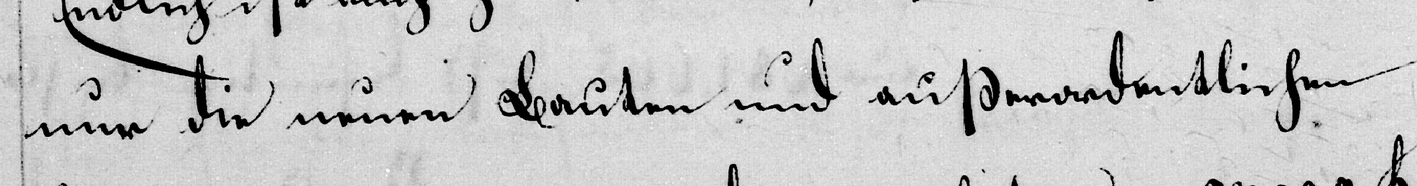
nur die neuen Bauten und außerordentlichen
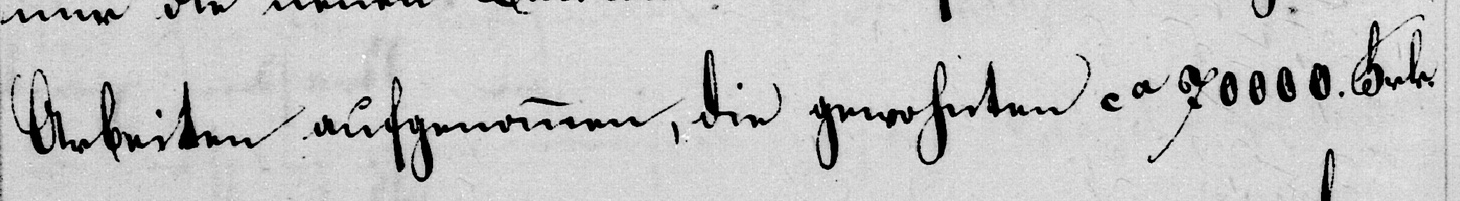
Arbeiten aufgenommen, die gewohnten ca 70000. Frk.
